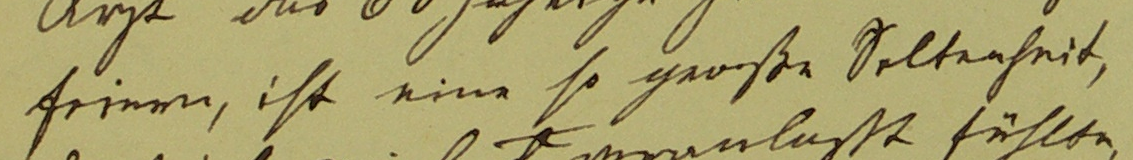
feiern ist eine so Große Seltenheit
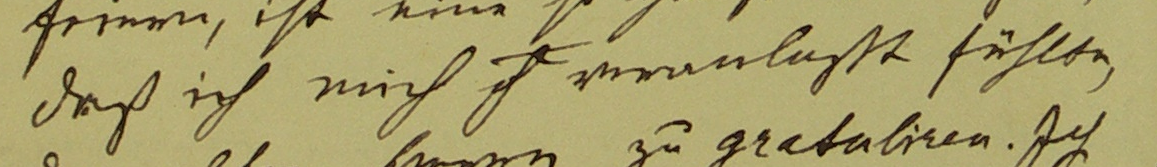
daß ich mich auch veranlaßt fühlte
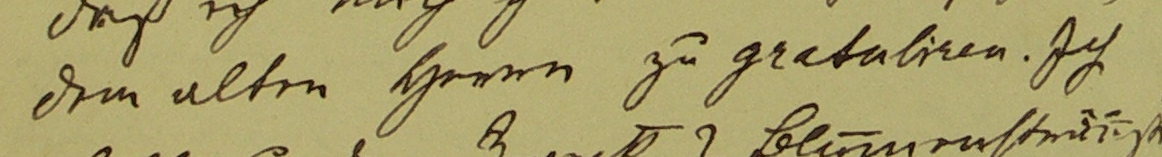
dem alten Herrn zu gratulieren. Ich
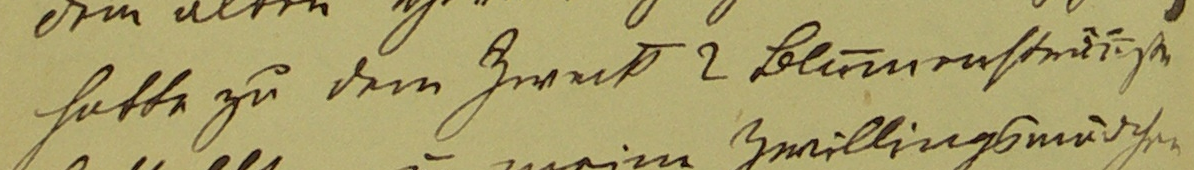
hatte zu dem Zweck2 Blumensträuße
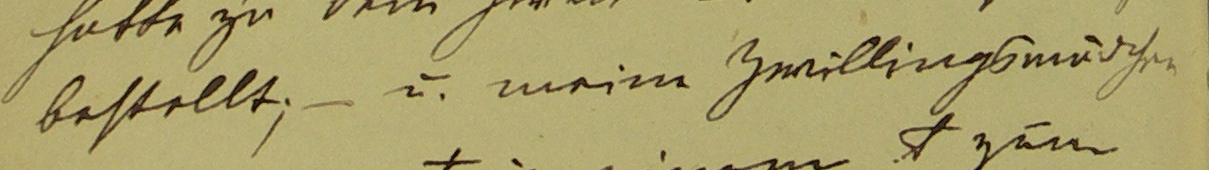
bestellt;- und meine Zwillingmädchenmit
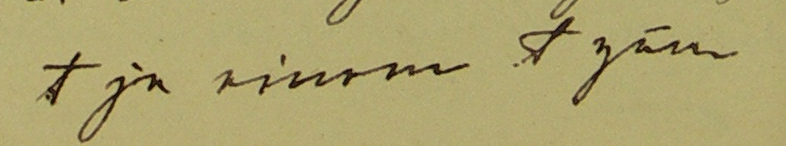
mit je einem mit zum
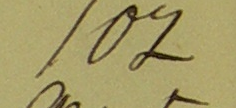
107
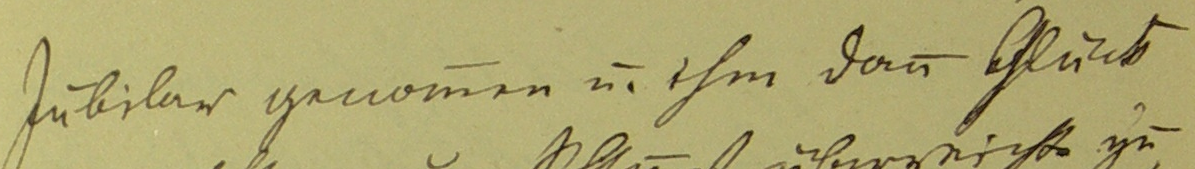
Jubilar genommen und ihm dann Glück
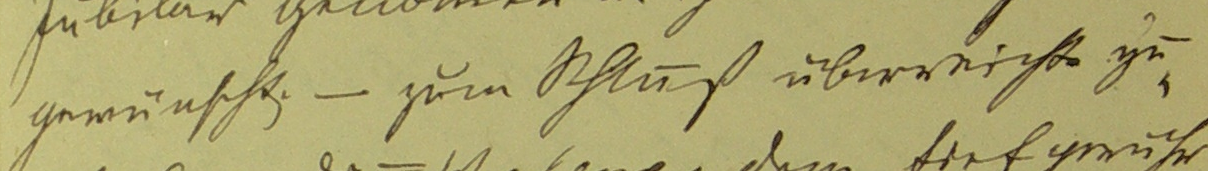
gewünscht.- zum Schluss überreichte zu¬
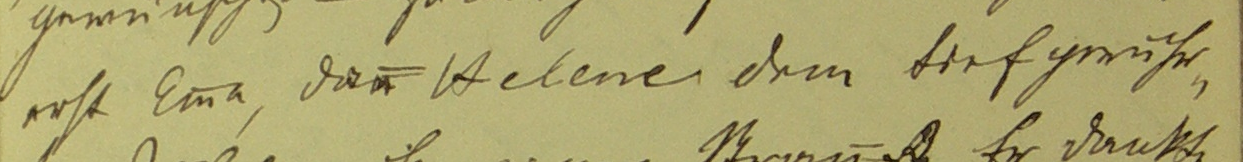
erst Ema dann Helene dem tiefgerühr¬
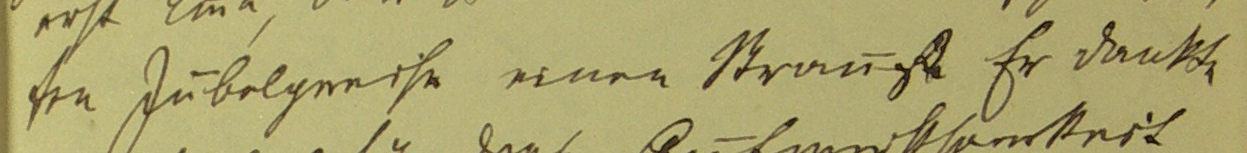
ten Jubelgreise einen Strauß. Er dankte
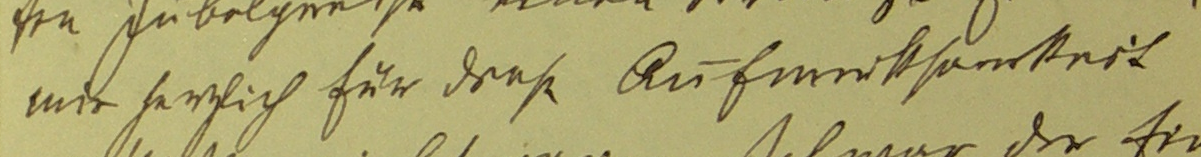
mir herzlich für diese Aufmerksamkeit
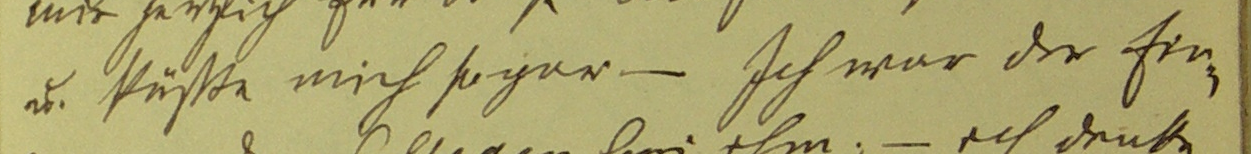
und küste mich sogar.- Ich war der ein¬
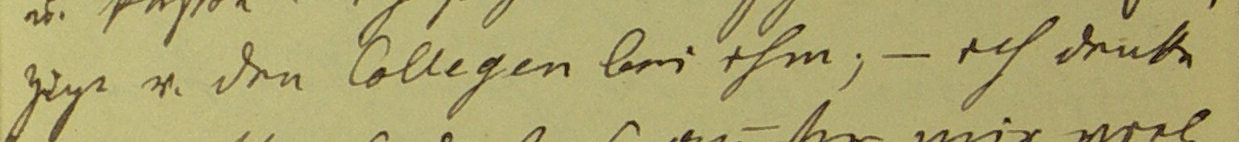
zige von den Collegen bei ihm.- Ich denke
